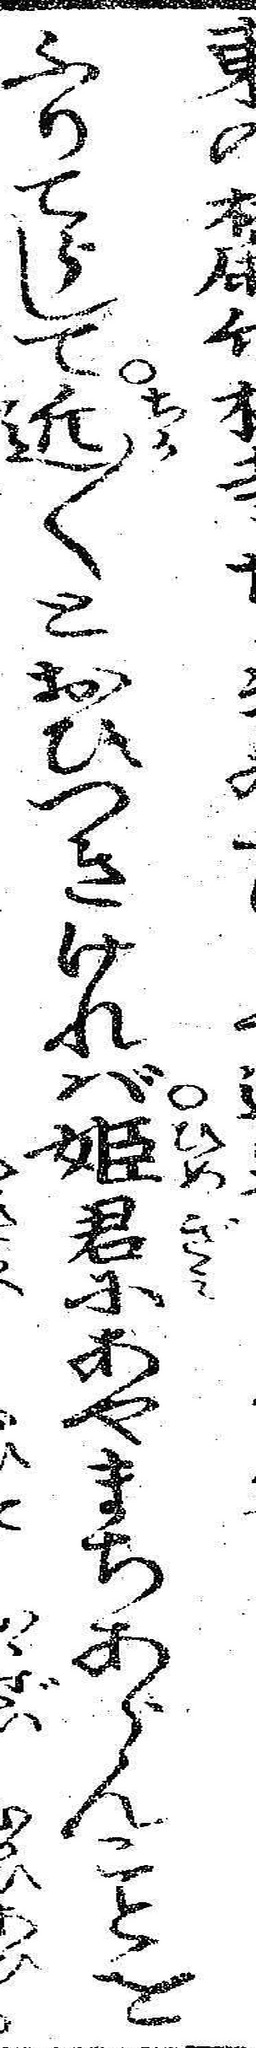ふりてらして。近々とおひつきければ。姫君にあやまちあらんことを
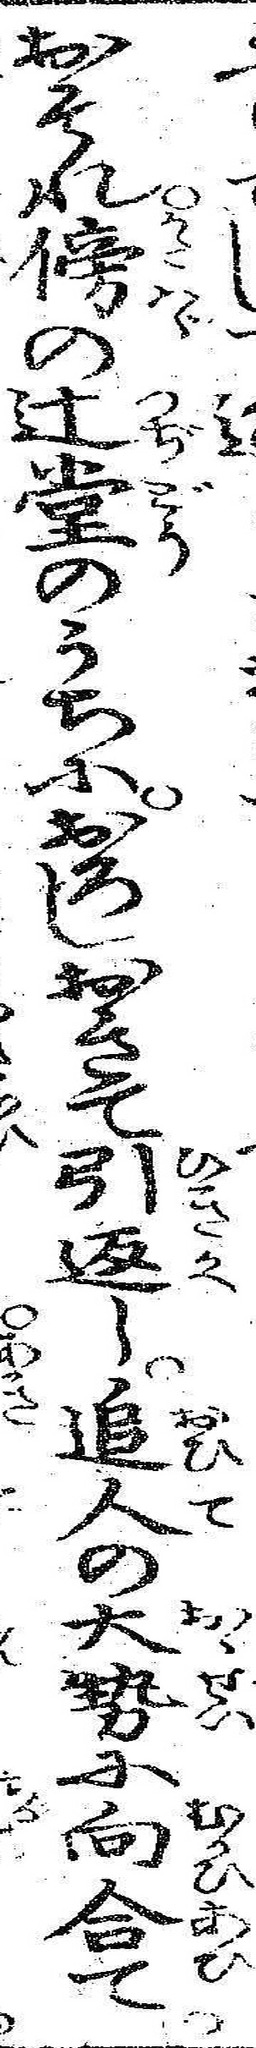おそれ。傍の辻堂のうちに。おろしおきて引返し。追人の大勢に向合て。
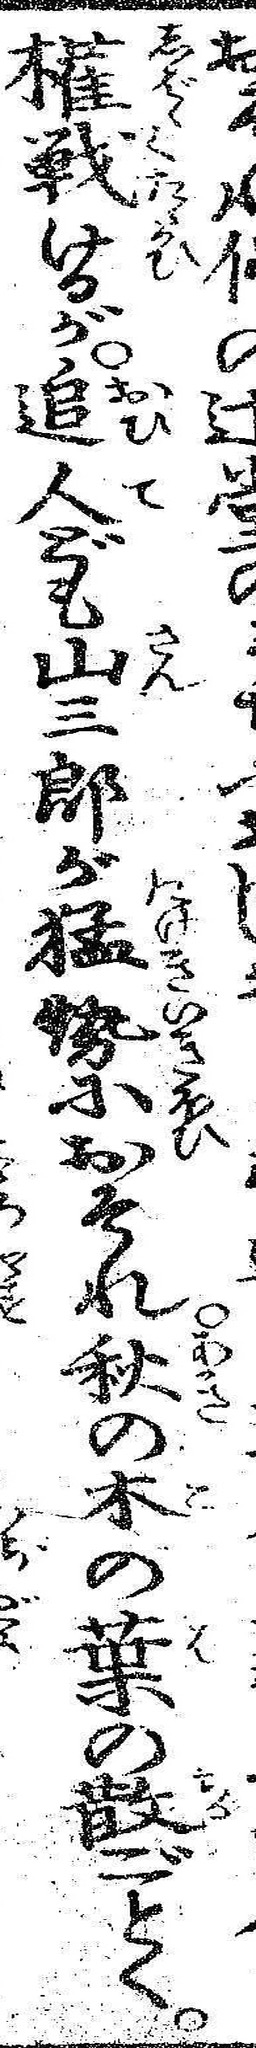権戦けるが。追人ども山三郎が猛勢におそれ。秋の木の葉の散ごとく。
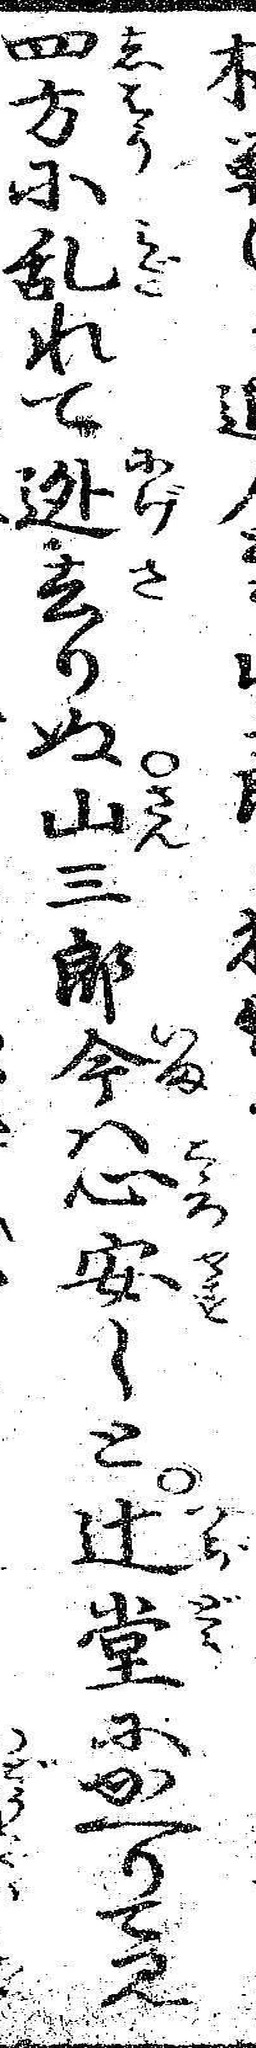四方に乱れて逃去りぬ。山三郎今は心安しと。辻堂にかへりて見
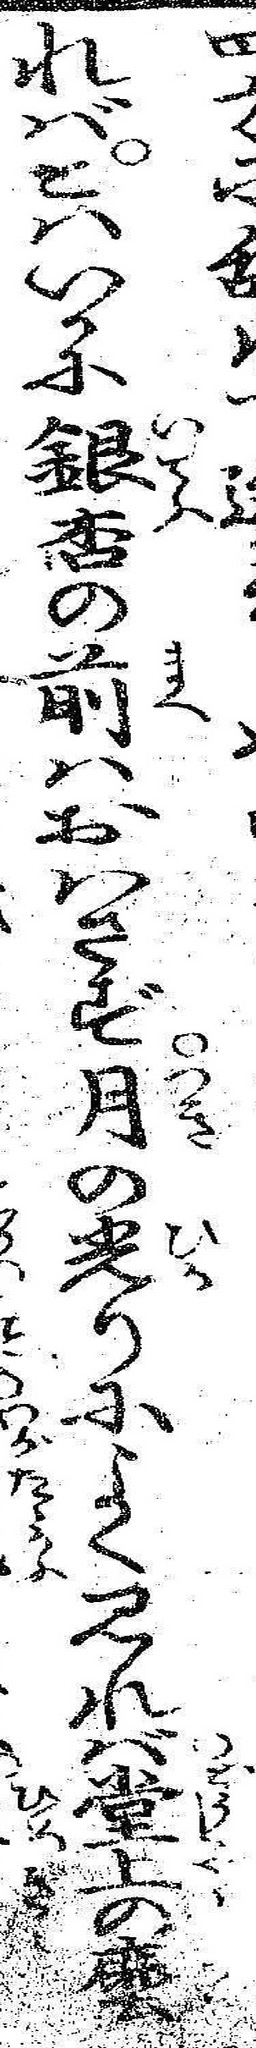れば。こはいかに銀杏の前はおわさず。月の光りによく見れば。堂上の塵
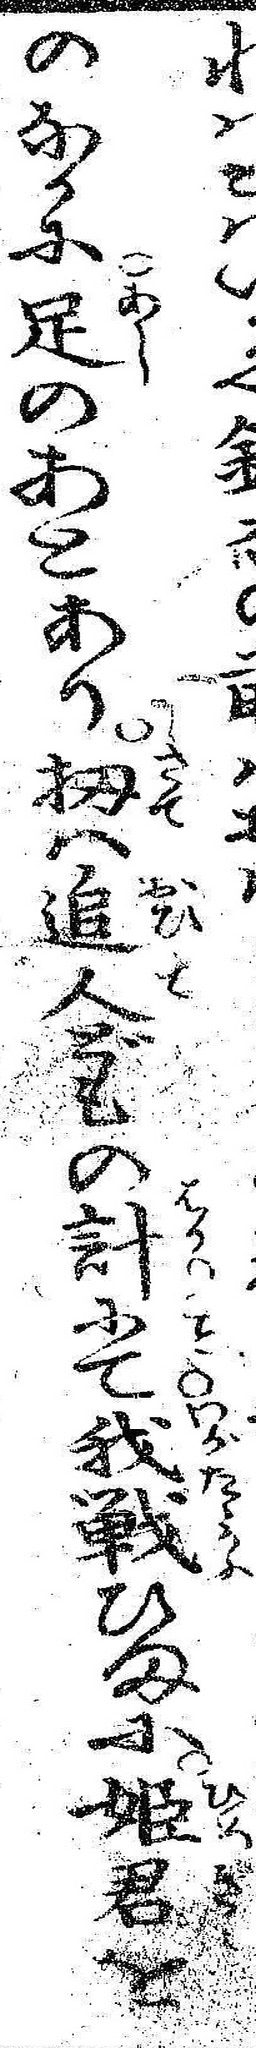のなかに。足のあとあり。扨は追人どもの計にて。我戦ひまに。姫君を

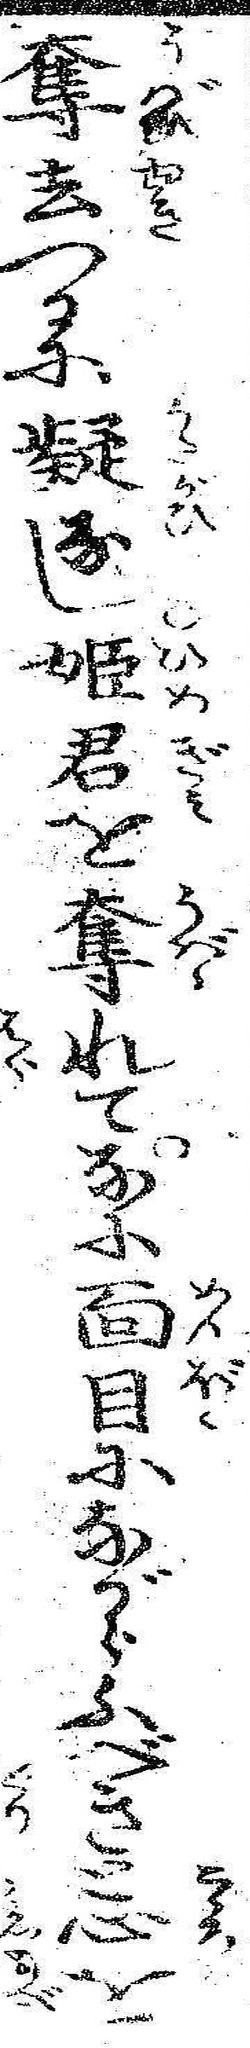奪去つるに疑なし。姫君を奪れて。なに面目にながらふべきと心を
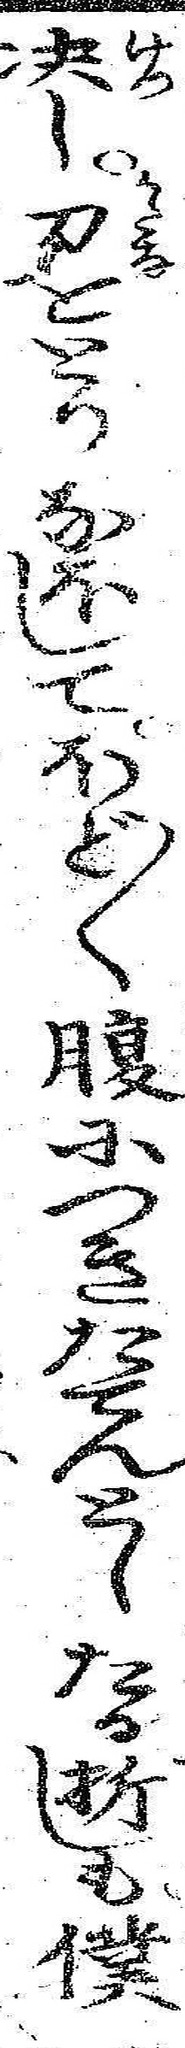決し。刀をとりなほして。ほど〳〵腹につきたてんとしたる折しも。僕
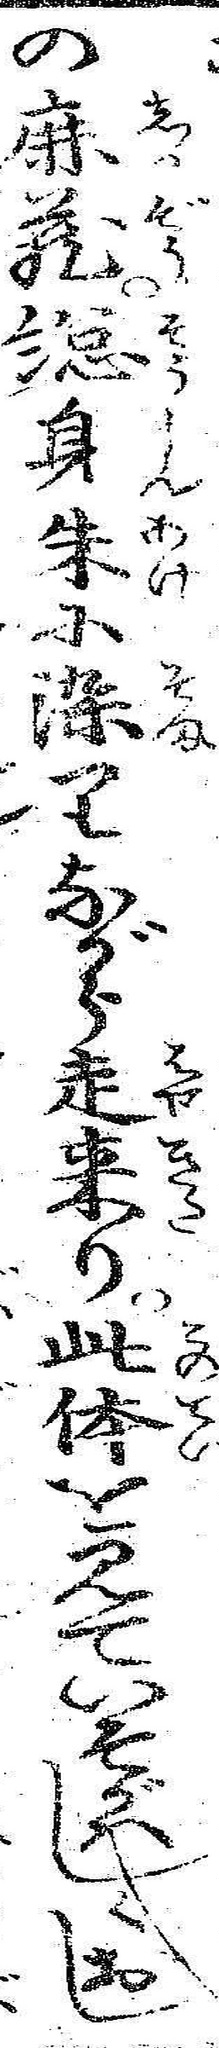の鹿蔵。総身朱に染りながら走来り。此体を見ていそがはしくおし
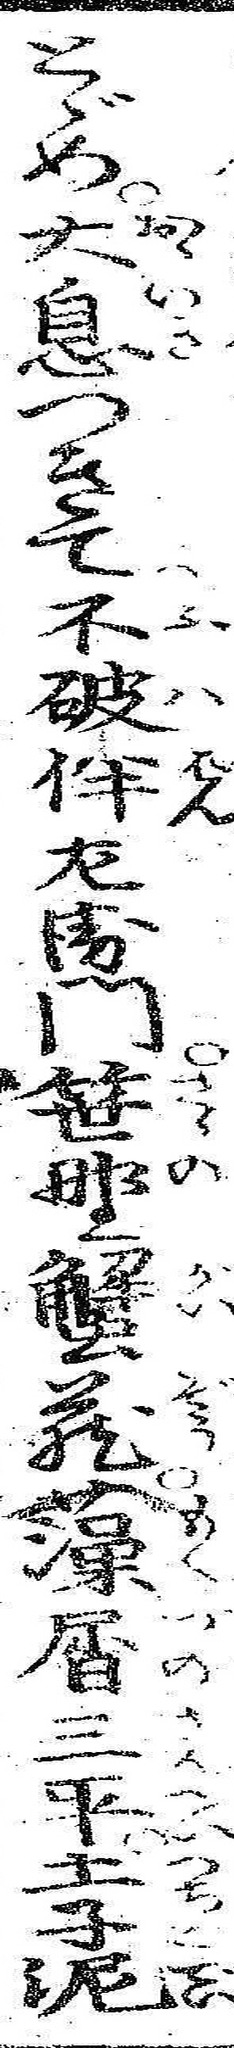とゞめ。大息つきて。不破伴左衛門。笹野蟹蔵。藻屑三平。土子泥
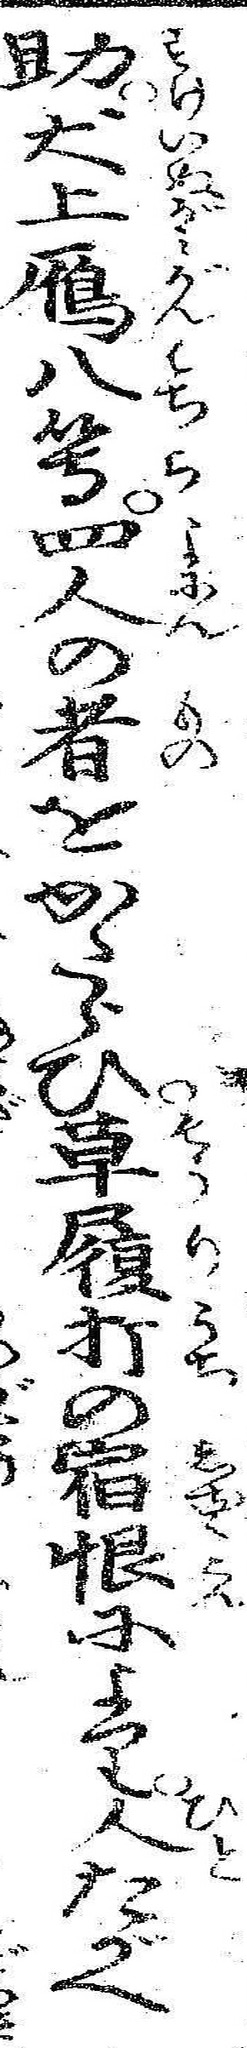助。犬上雁八等。四人の者をかたらひ。草履打の宿恨により。人たがへ
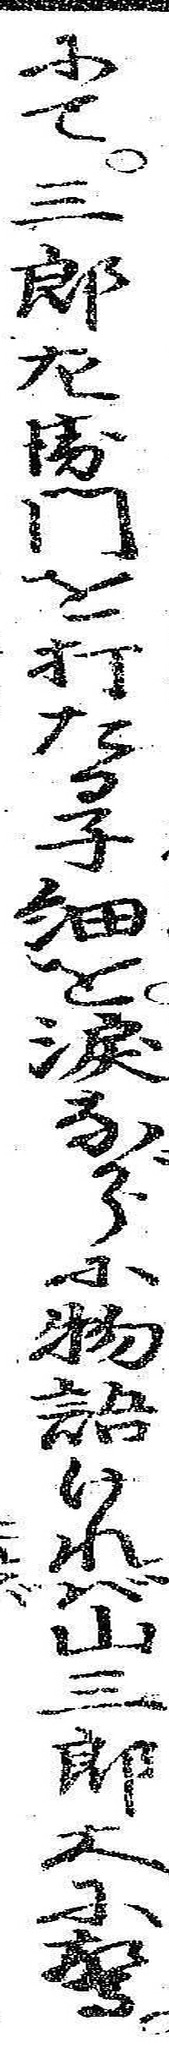にて。三郎左衛門を打たる子細を。涙ながらに物語ければ。山三郎大に驚。
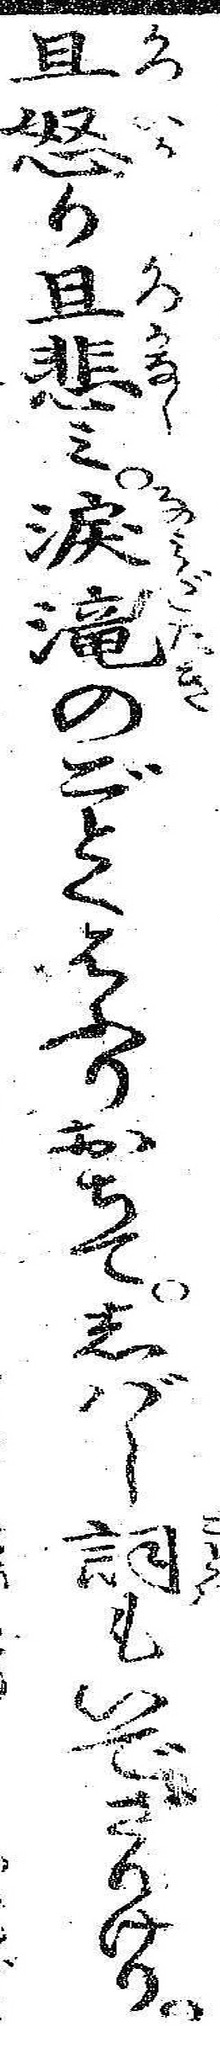旦怒り旦悲み。涙滝のごとくはふりおちて。しばし詞もいでざりけり。
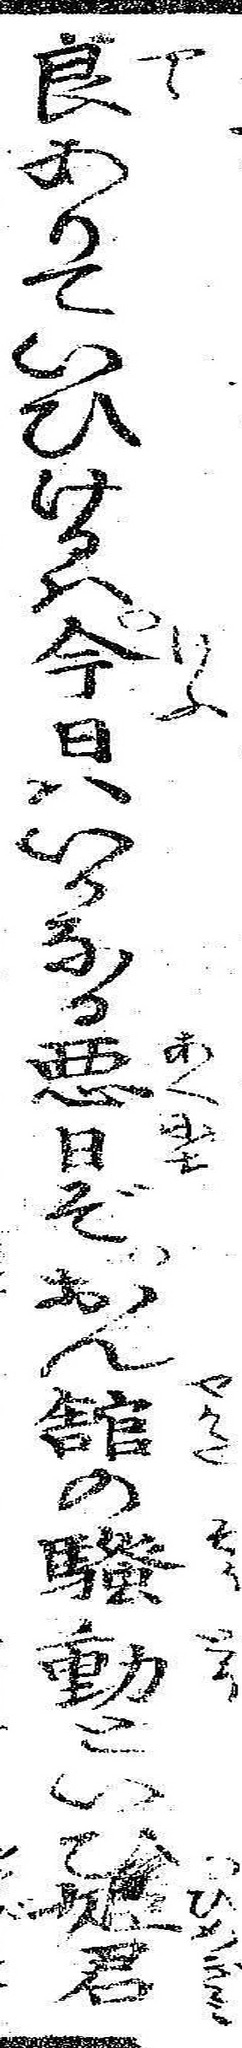良ありていひけるは。今日はいかなる悪日ぞ。おん館の騒動といひ。姫君
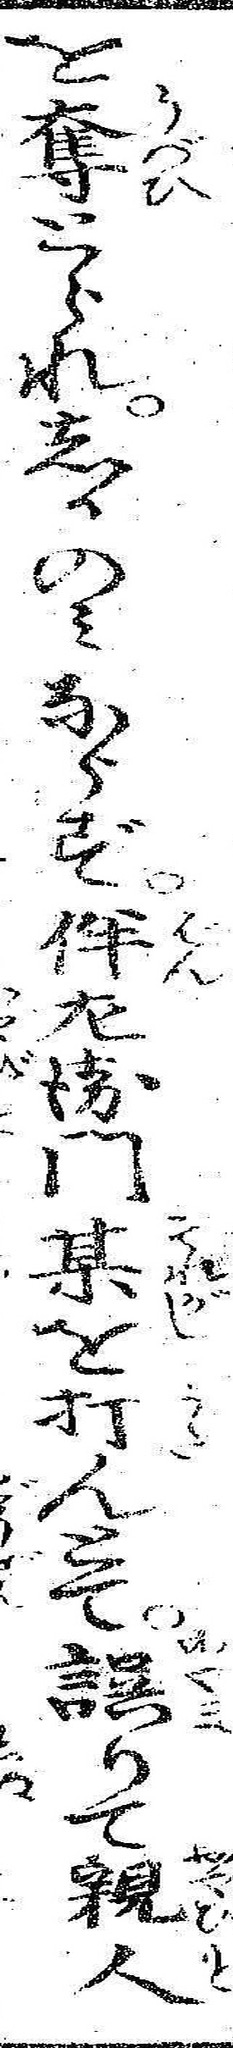を奪とられ。しかのみならず。伴左衛門某を打んとて。誤りて親人
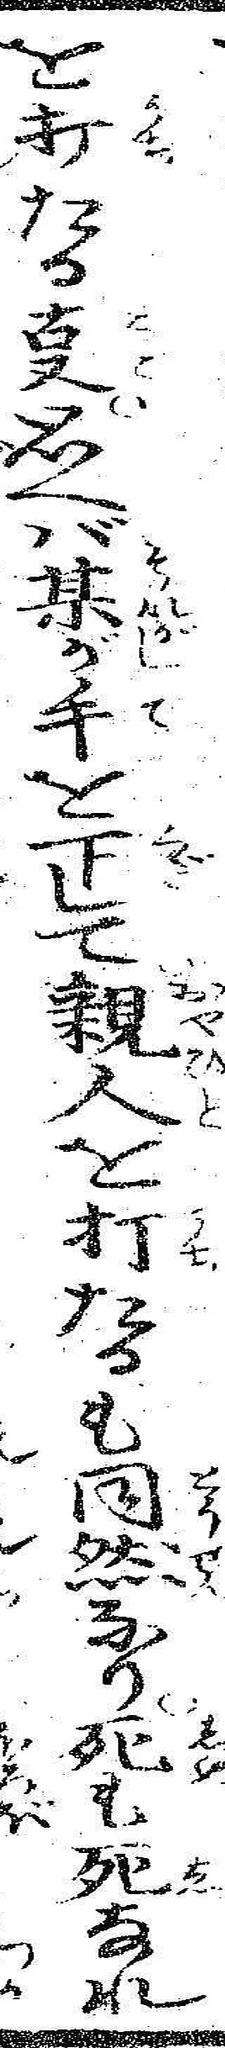を打たる事。思へば某が手を下して親人を打たるも同然なり。死も死なれ
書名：昔話稲妻表紙
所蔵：国文学研究資料館
